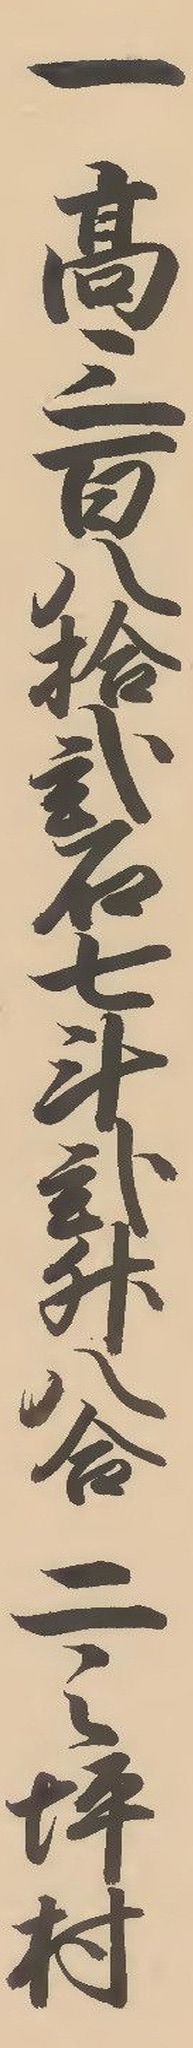一高三百八拾弐石七斗弐升八合二之坪村
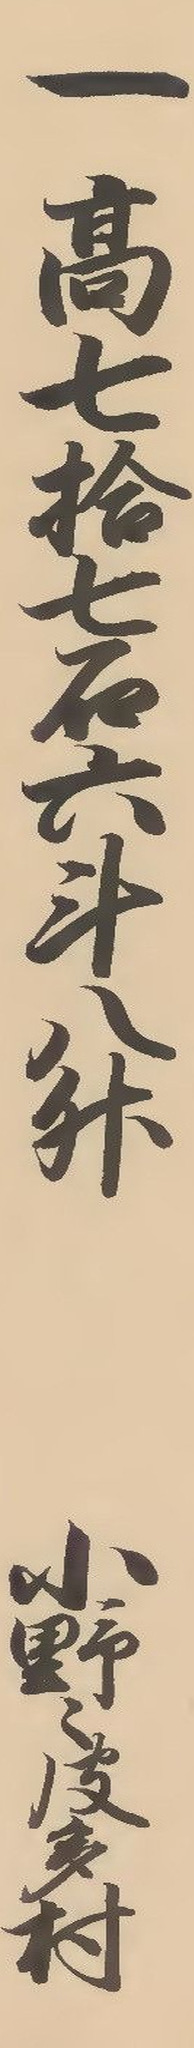一高七拾七石六斗八升小野々皮多村
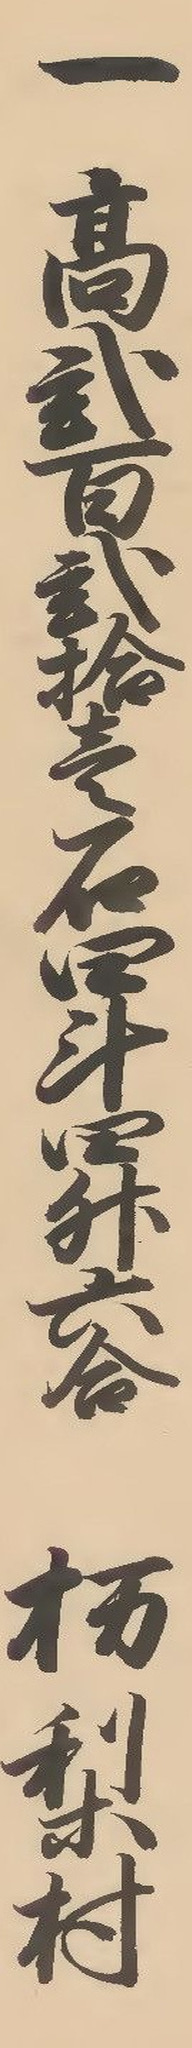一高弐百弐拾壱石四斗四升六合栃梨村

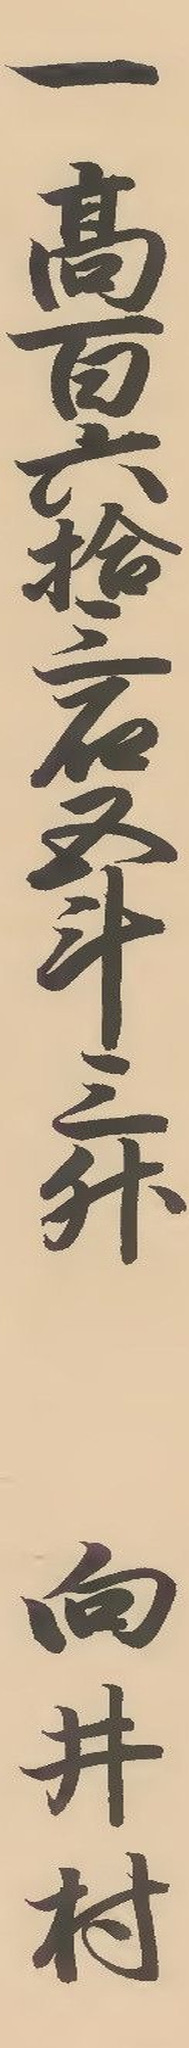一高百六拾三石五斗三升向井村
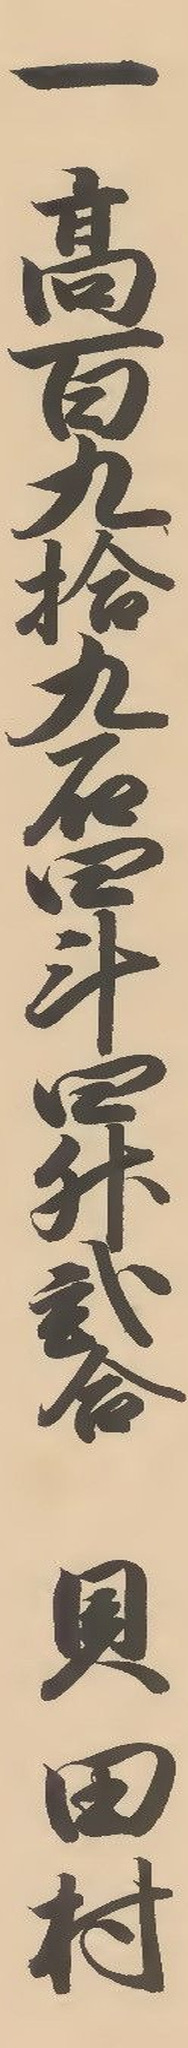一高百九拾九石四斗四升弐合貝田村
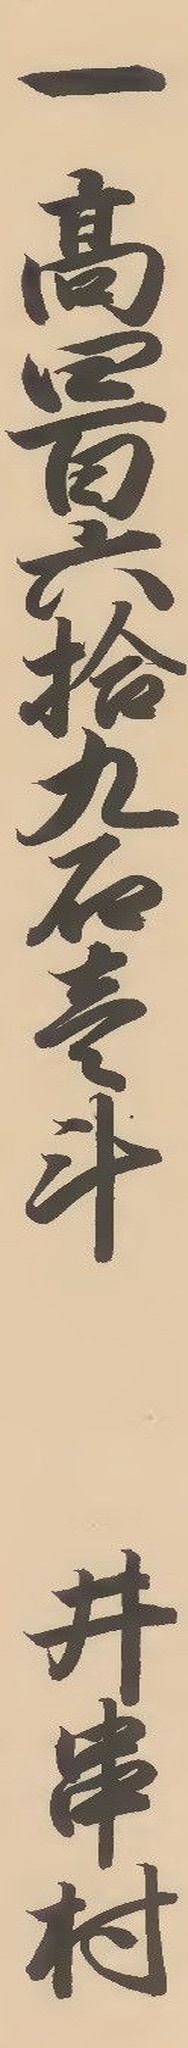一高四百六拾九石壱斗井串村
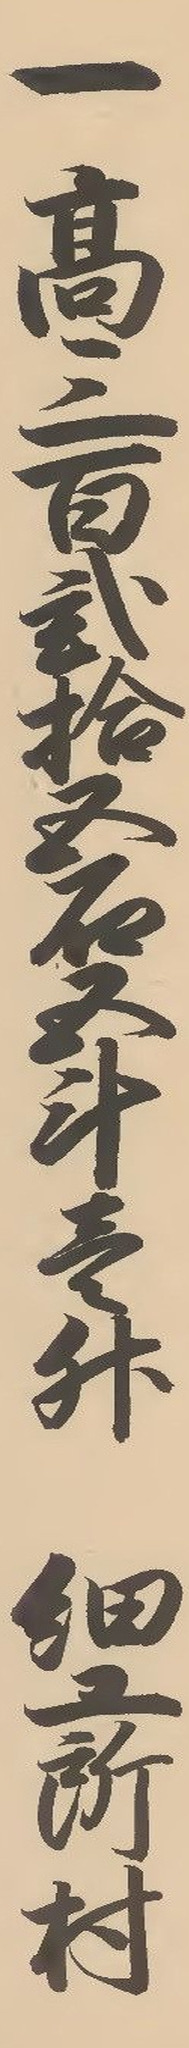一高三百弐拾五石五斗壱升細工所村
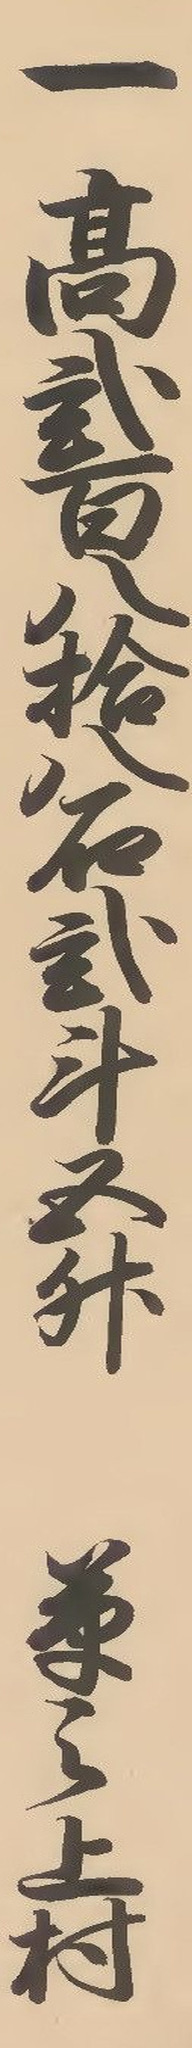一高弐百八拾八石弐斗五升草之上村
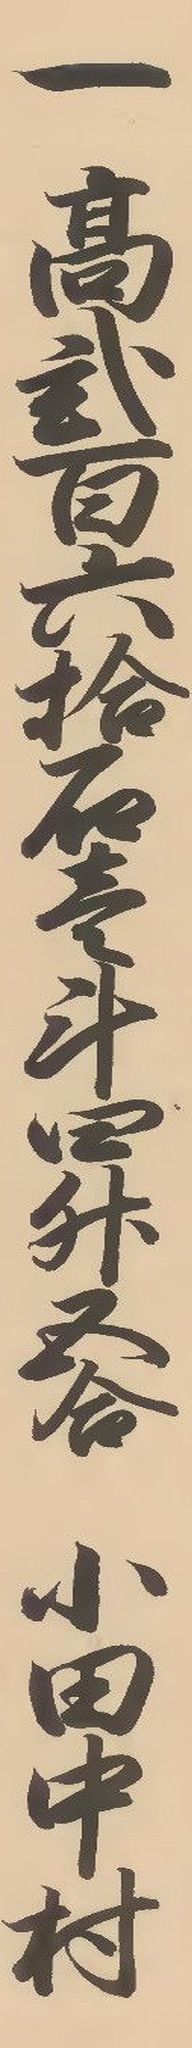一高弐百六拾石壱斗四升五合小田中村
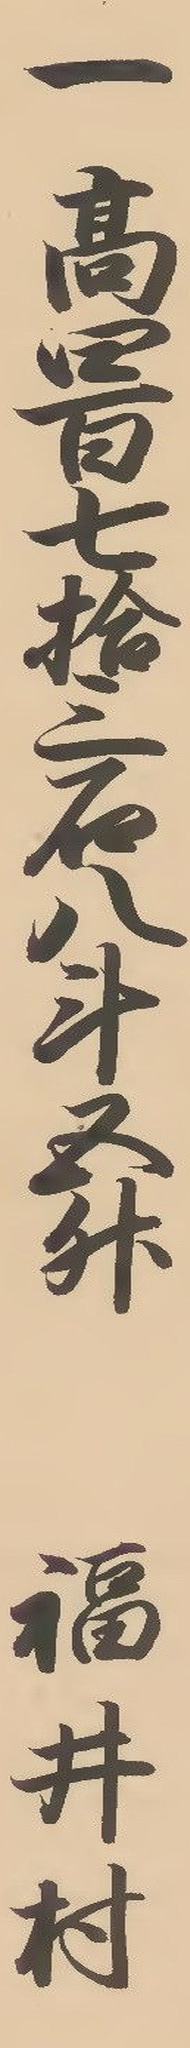一高四百七拾三石八斗五升福井村

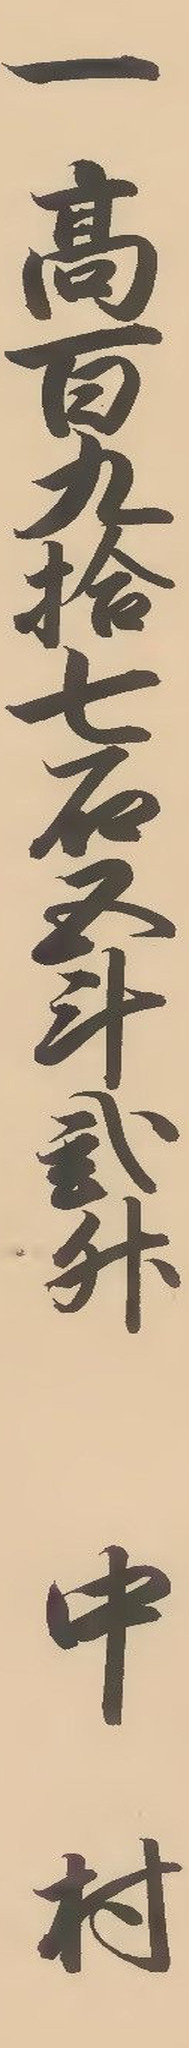一高百九拾七石五斗弐升中村
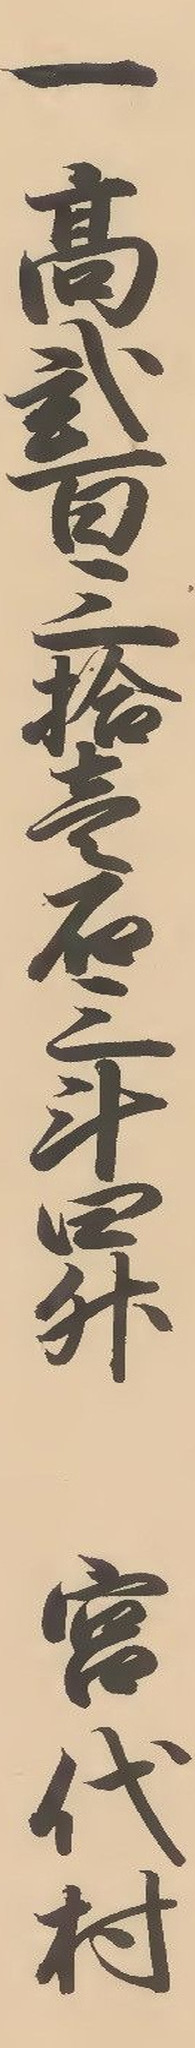一高弐百三拾壱石三斗四升宮代村
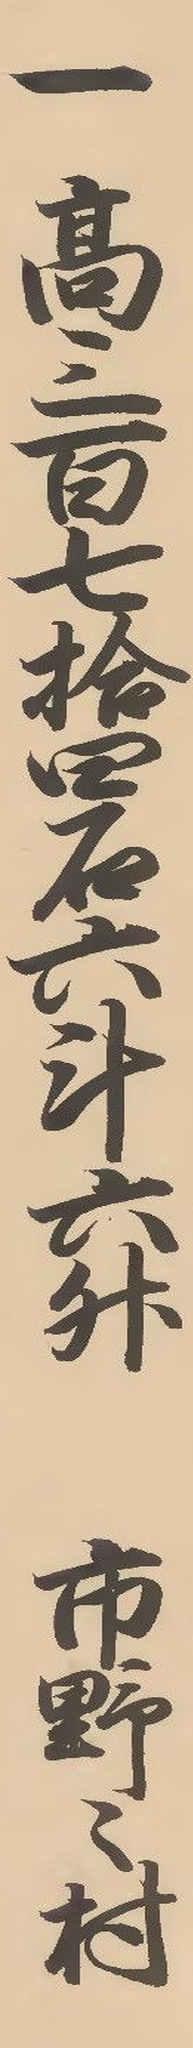一高三百七拾四石六斗六升市野々村
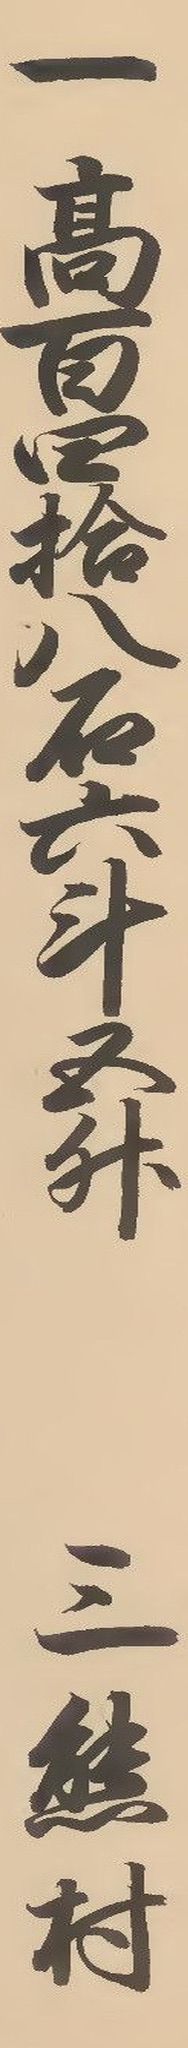一高百四拾八石六斗五升三熊村
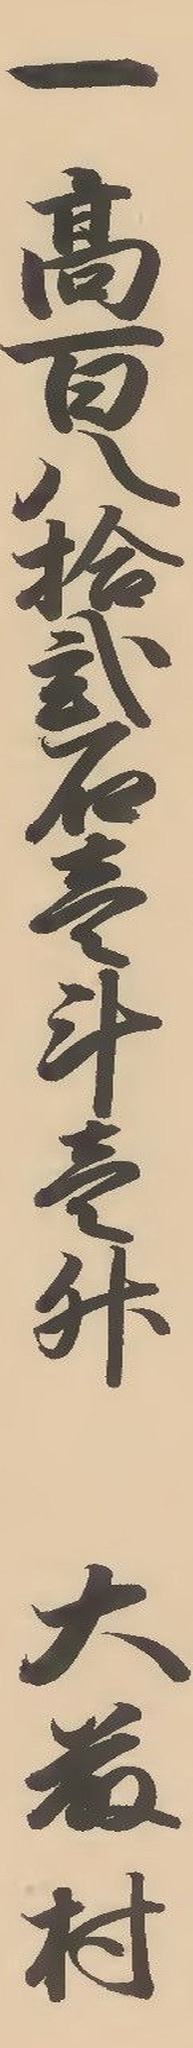一高百八拾弐石壱斗壱升大藤村
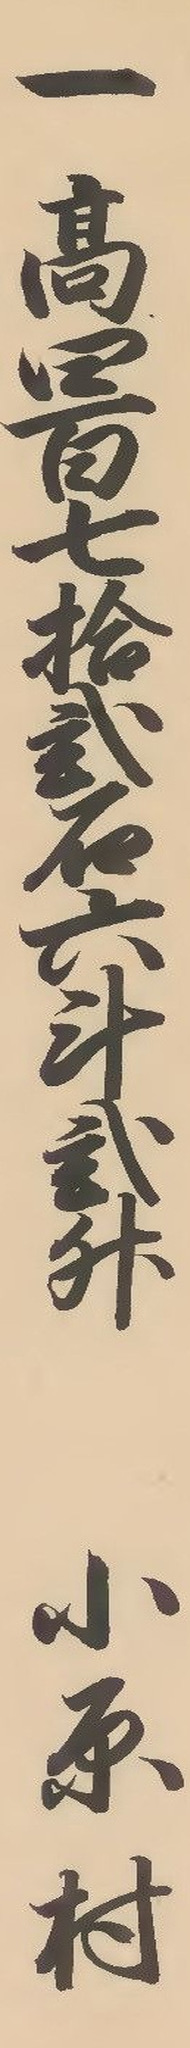一高四百七拾弐石六斗弐升小原村
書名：丹波国郷帳
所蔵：国立公文書館 National Archives of Japan
